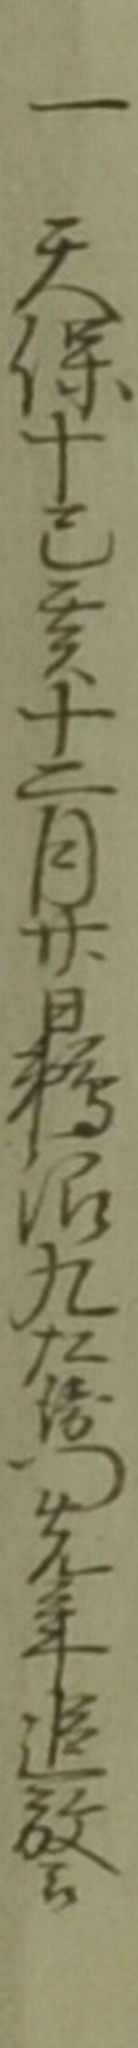一天保十己亥十二月廿日鵜沼九左衛門先年追放被
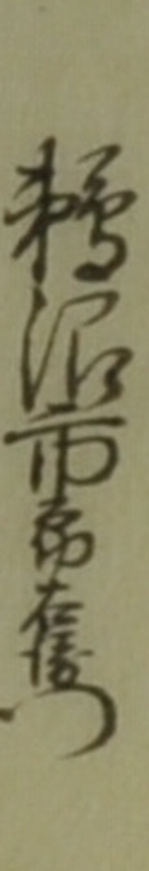鵜沼市郎右衛門
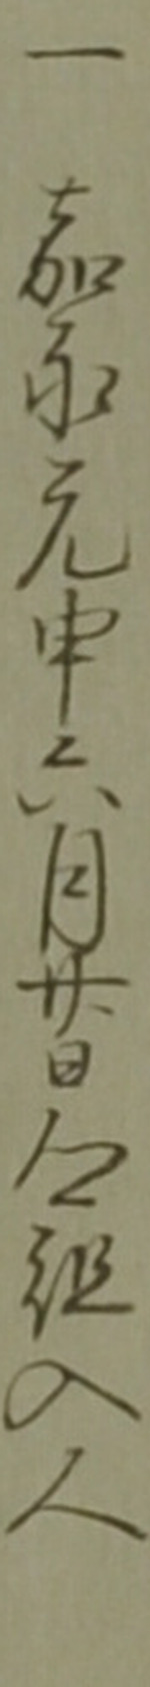一嘉永元申六月廿日郷組入人

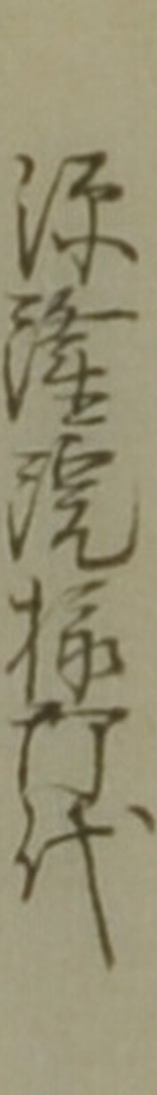源隆院様御代
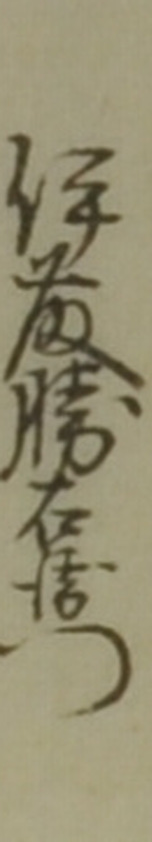伊藤勝右衛門
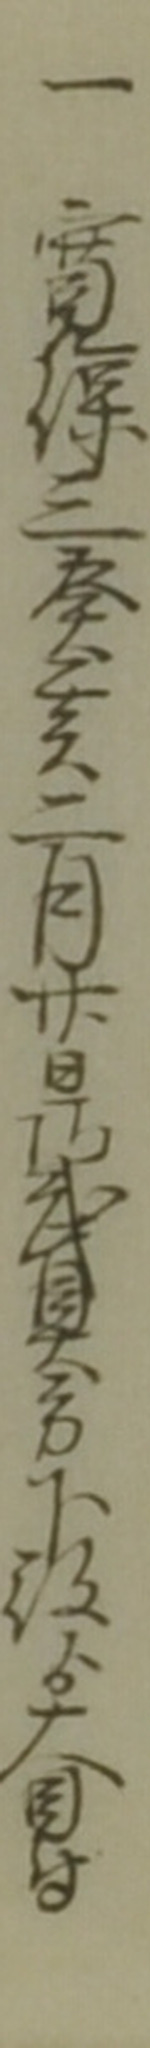一寛保三癸亥二月廿日御武具方下役ゟ大目付
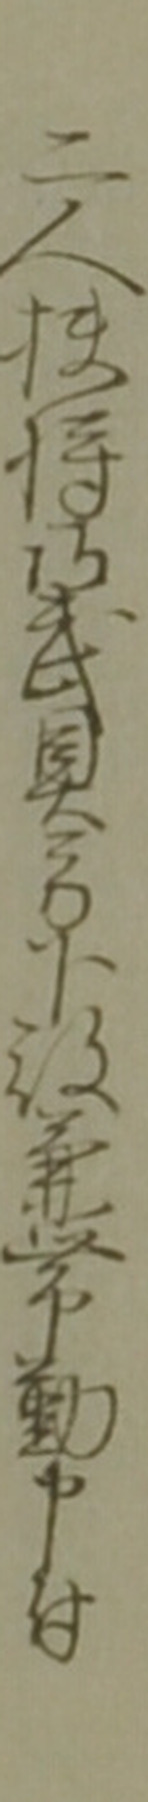二人扶持御武具方下役兼帯勤申付
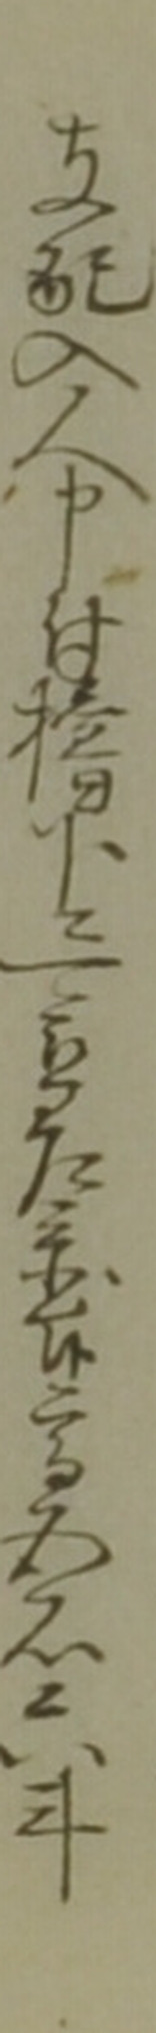支配入人申付◻︎下ニ可被差置候高五石六斗
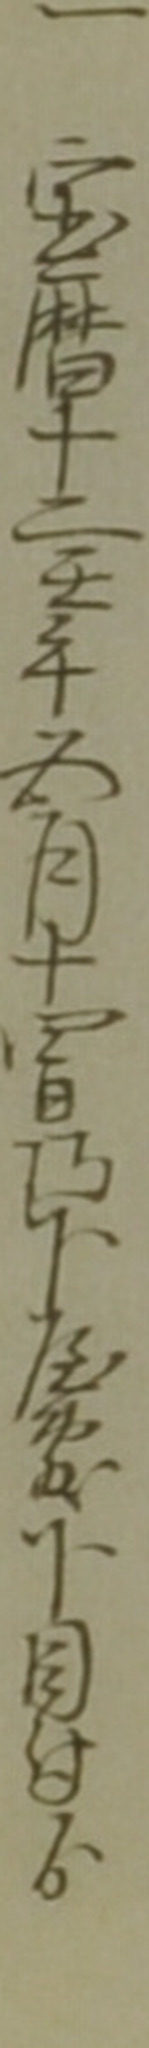一宝暦十二壬午五月十四日御下屋敷下目付ゟ
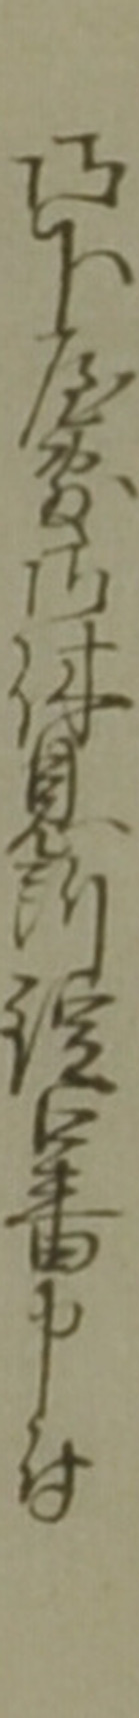御下屋敷御休息所錠口番申付
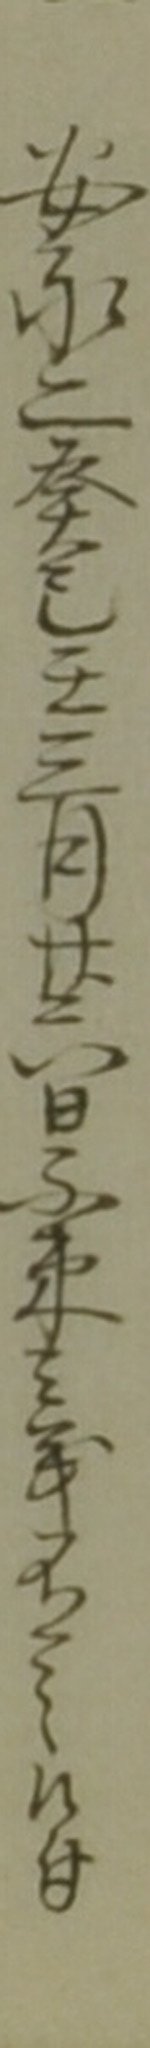一安永二癸巳閏三月廿六日不束之義有之候付
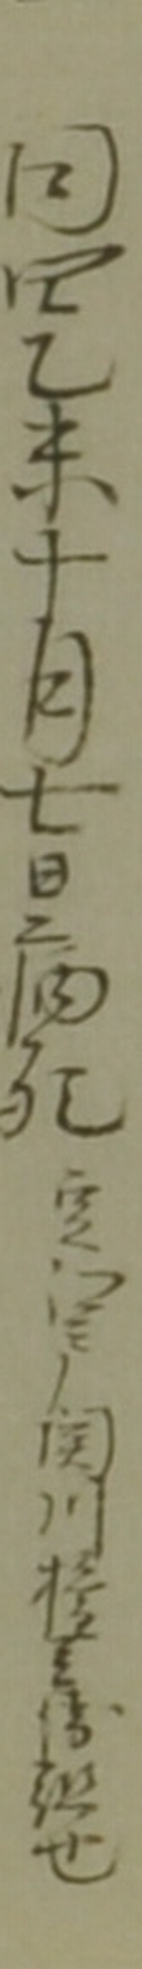一同四乙未十月七日病死定江戸関川権兵衛組也
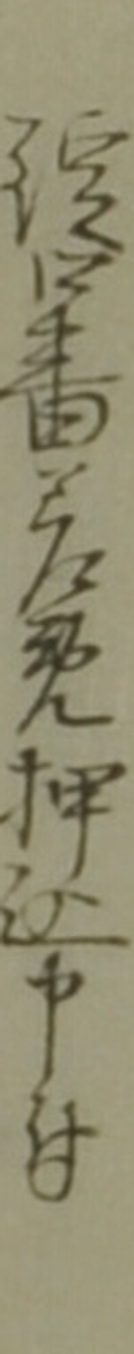錠口番差免押込申付
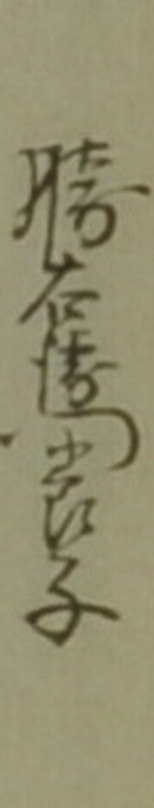勝右衛門養子
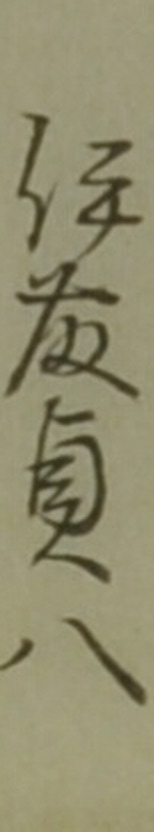伊藤貞八
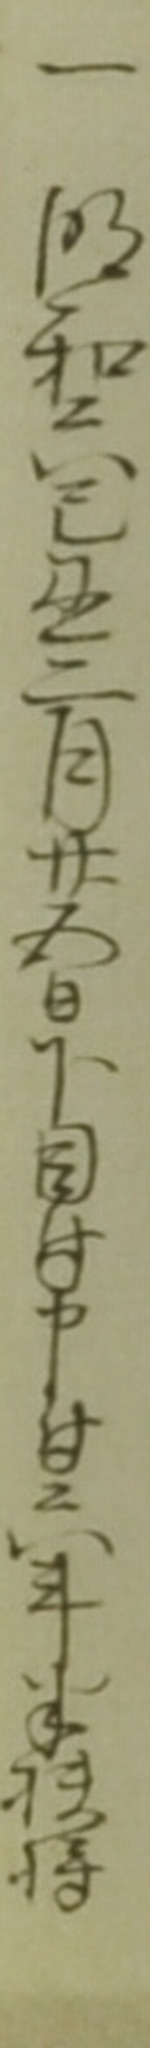一明和六己丑二月廿五日下目付申付六斗半扶持
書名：無足諸士勤仕録（九）
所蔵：伊那市立高遠町図書館・合同会社AMANE
